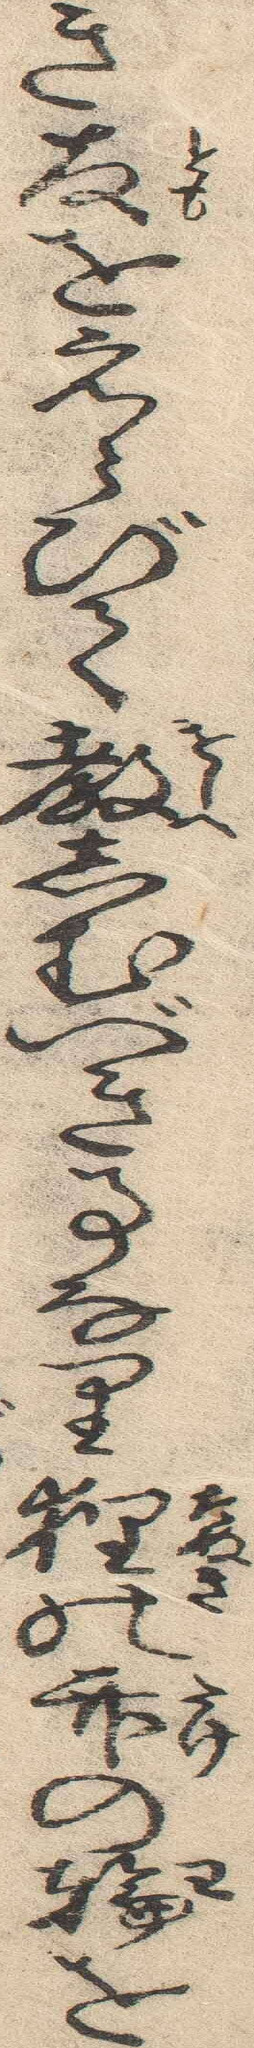き友をえらびて教しむべき事なり狸の竹の輪を
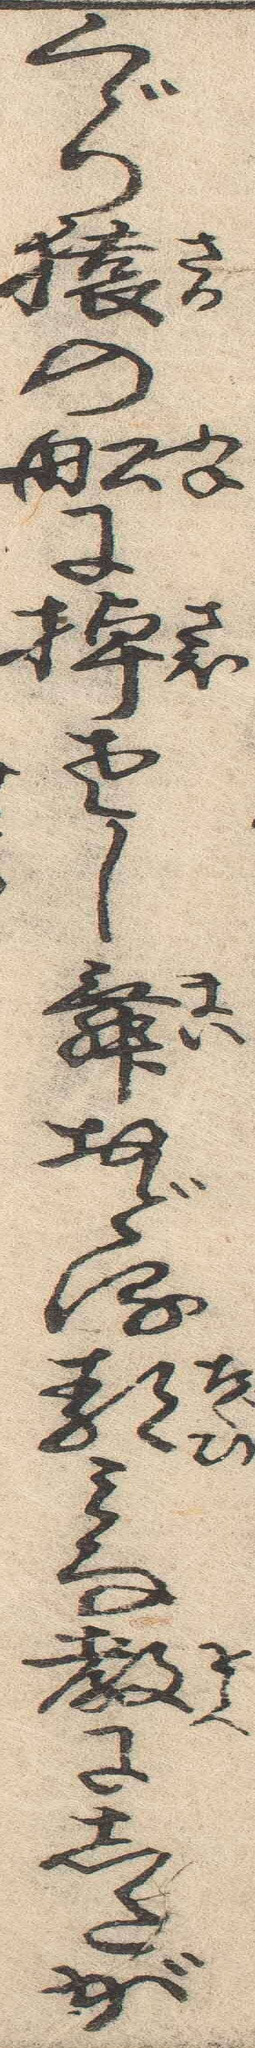くゞり猿の船に棹さし舞おどる類みな教にしたが
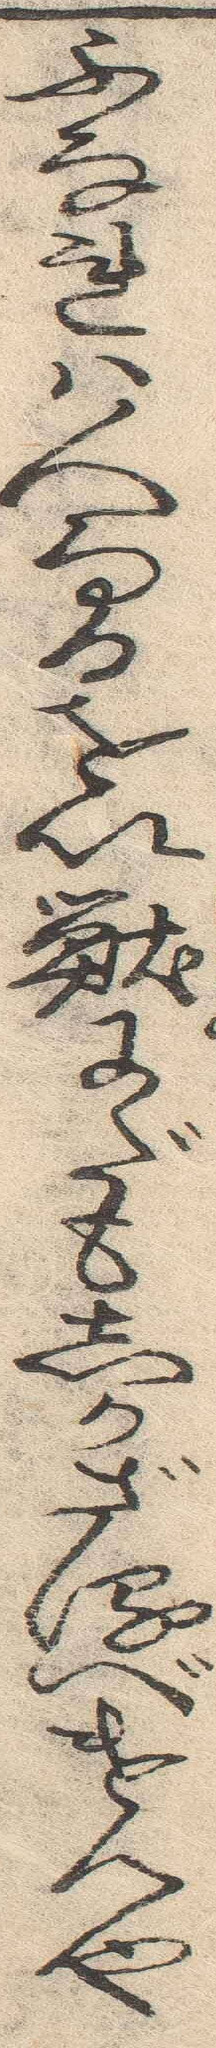ふなれは人なるを以獣にだもしかざるべけんや
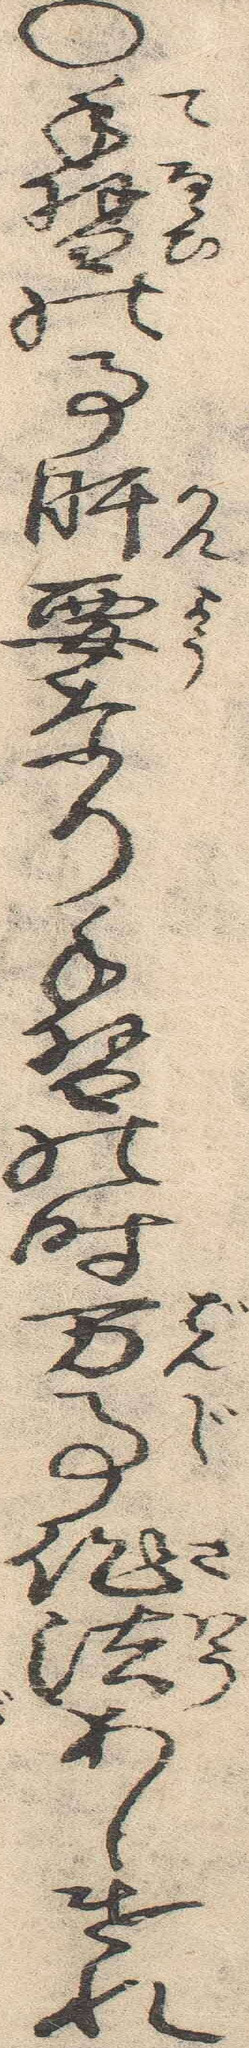○手習の事肝要なり手習の時万事作法あしけれ
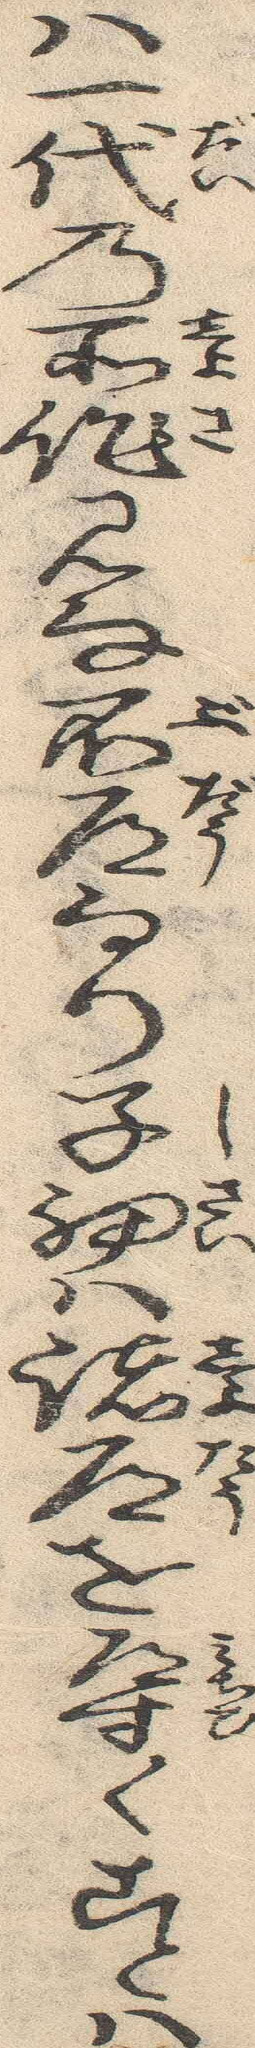は一代の所作みな不道なり子細は諸道を導くことは
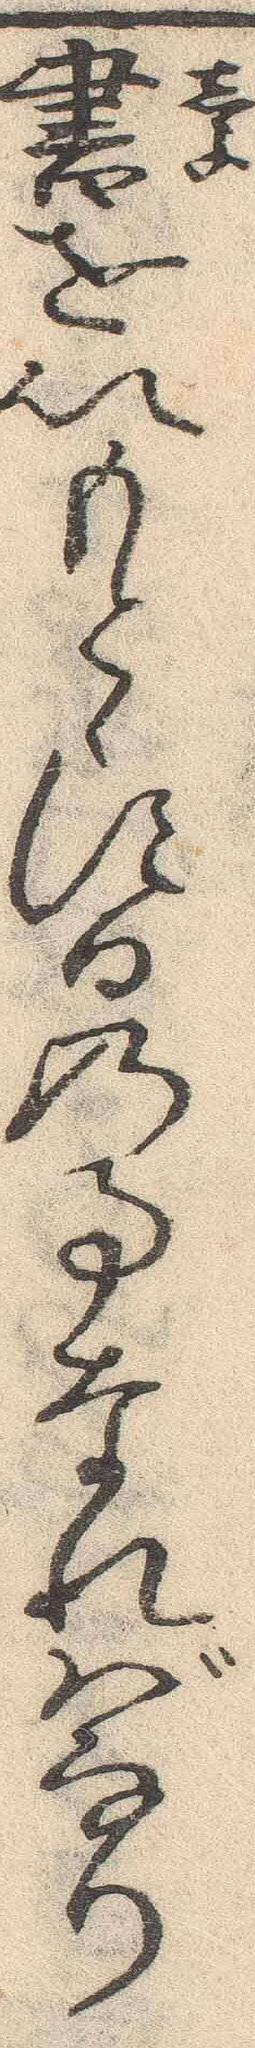書を以もとゝするの事なればなり
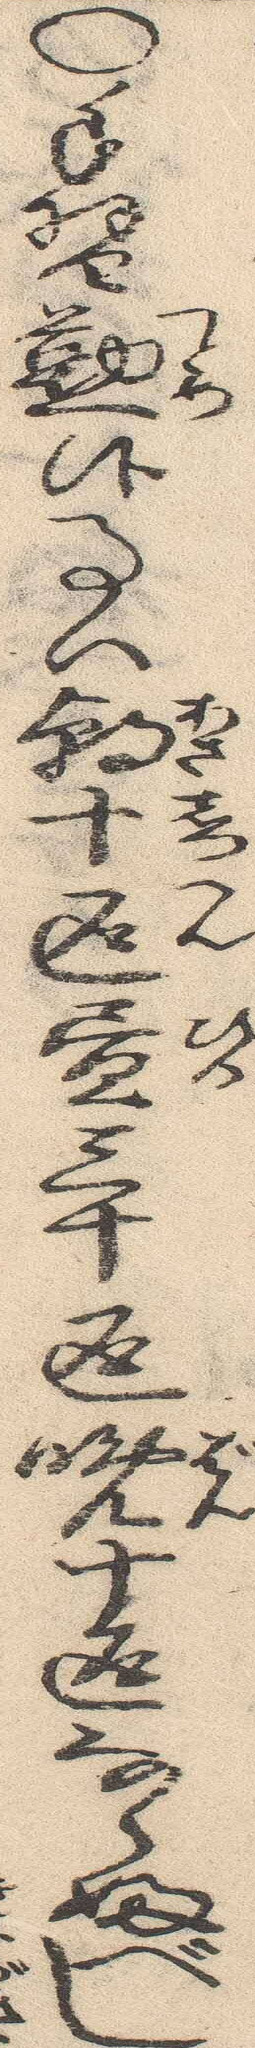○手習勤候事は朝十返昼三十返晩十返ならふべし
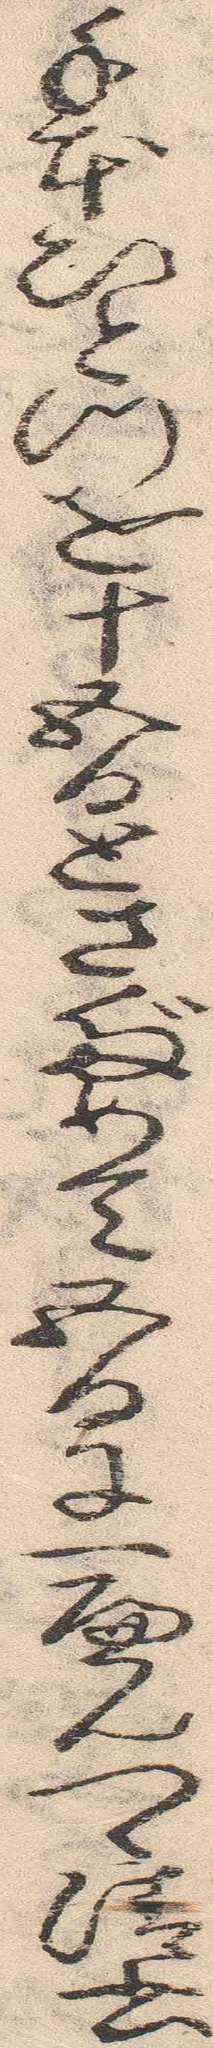手本ひとつを十五日とさだめて五日に一へんつゝ清書
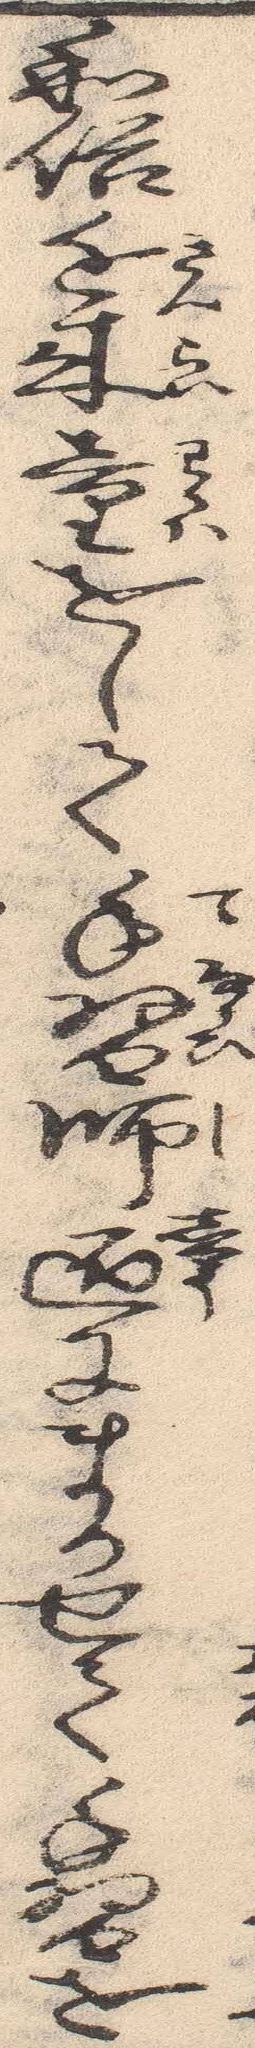和俗近来童をして手習師匠にまかせて手習を
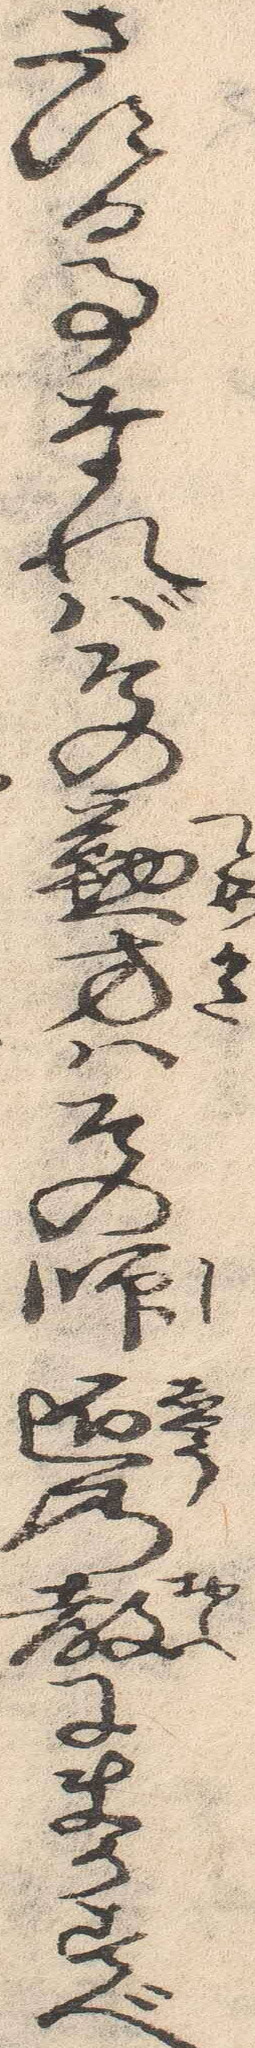さする事なればその勤方はその師匠の教にまかすべ
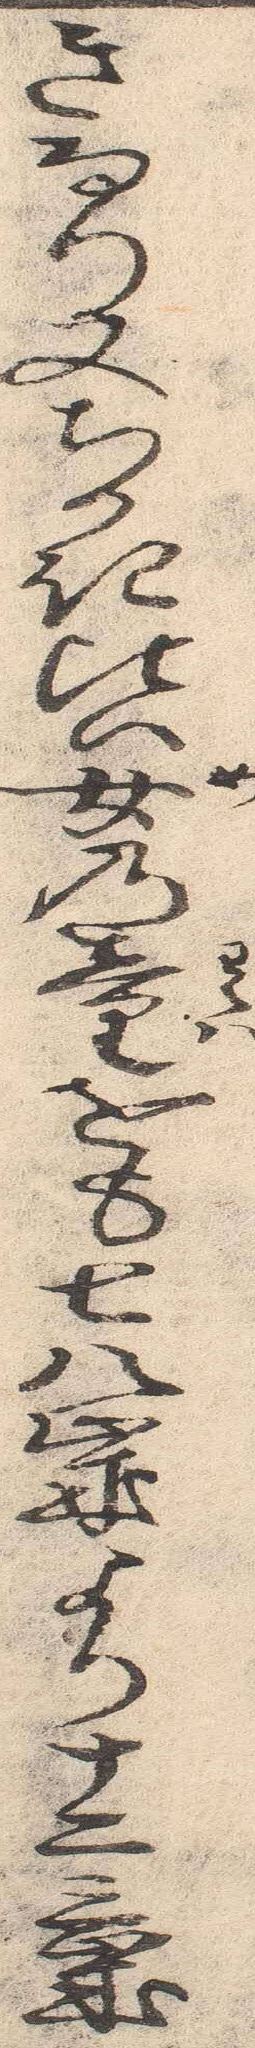きなり又ちかき比は女の童をも七八歳より十二三歳
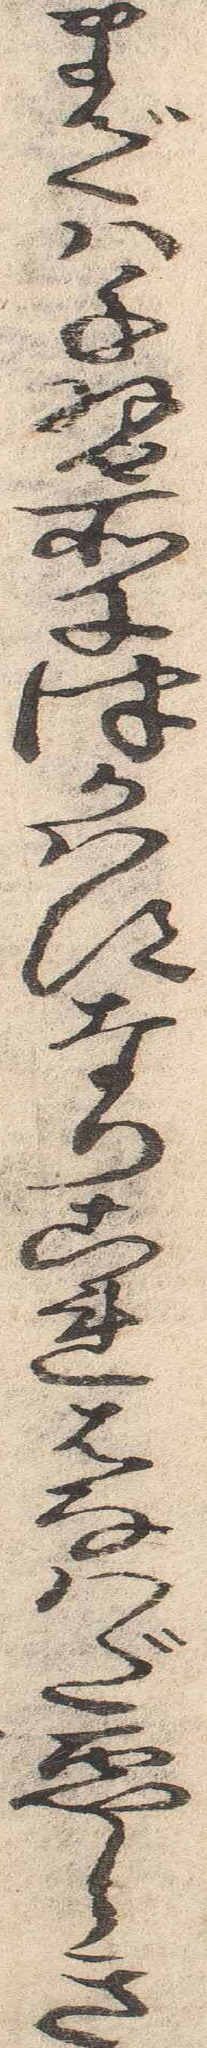までは手習所につかはすなりこれはなはだ悪しき
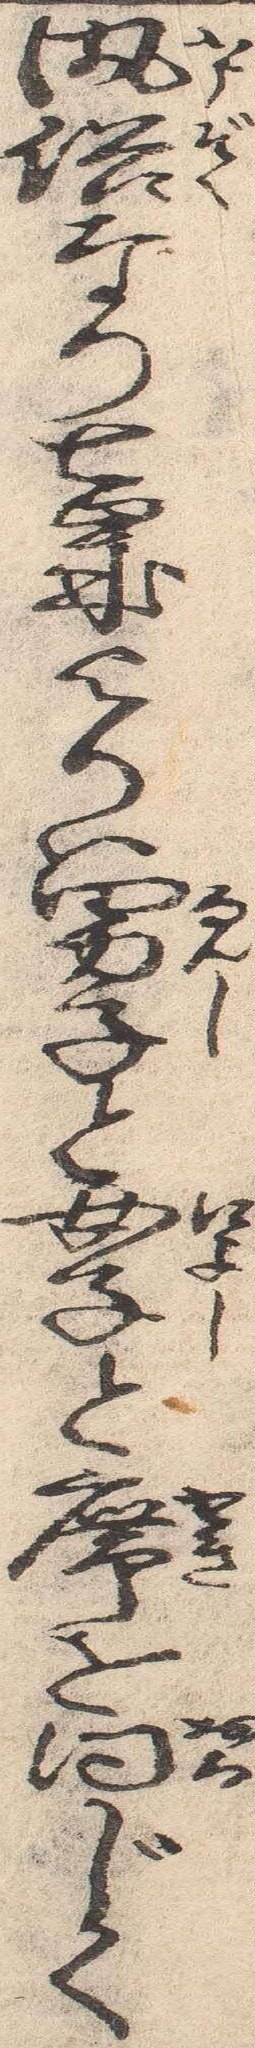風俗なり七歳よりは男子と女子と席を同じく
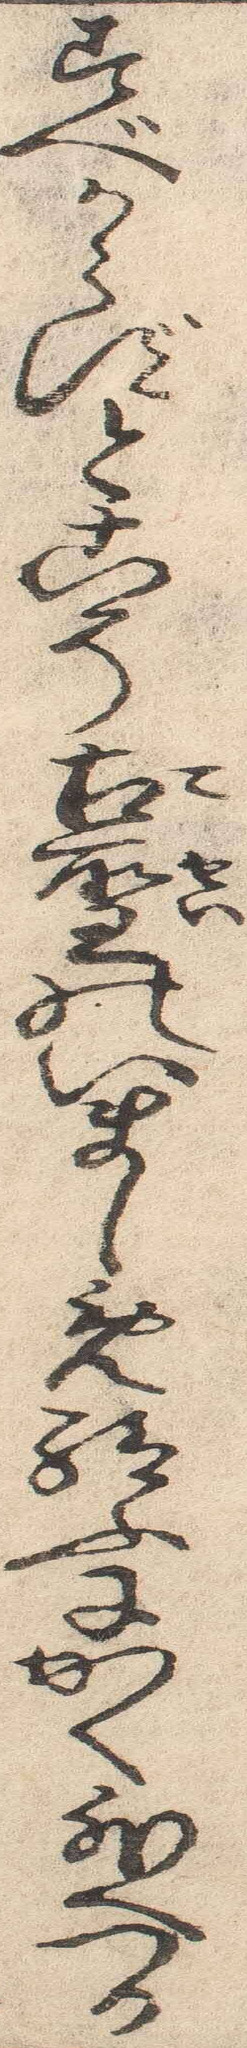すべからずとこそ古聖のいましめ給ふにかく外へつか
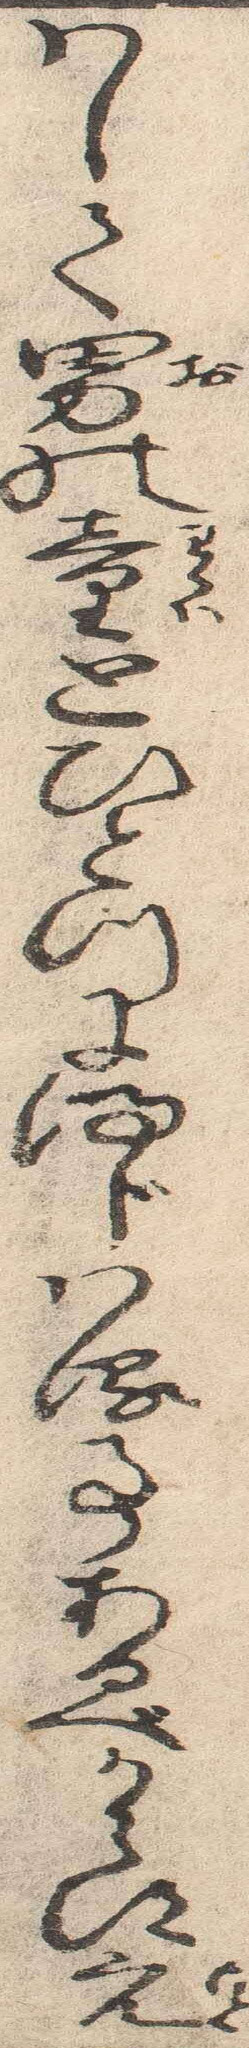わして男の童とひとつにまじはる事あるべからす元
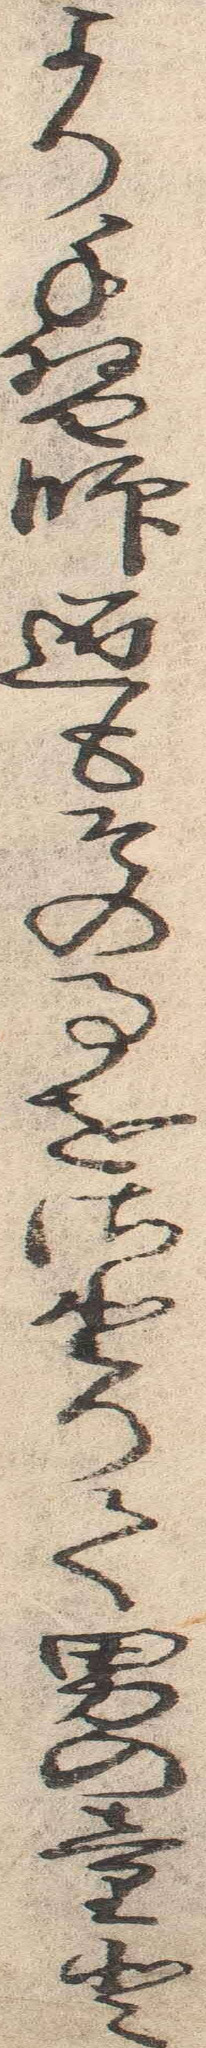より手習師匠もその事をさとりて男の童と
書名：小児必用養育草
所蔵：東京学芸大学附属図書館 国文学研究資料館
